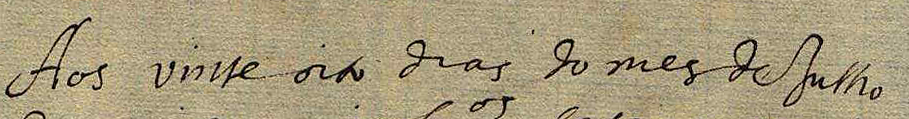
Aos vinte oito dias do mes de Julho
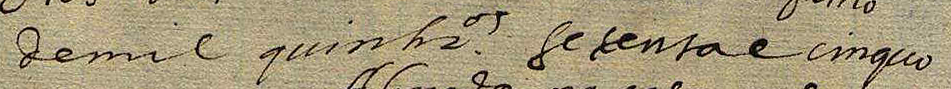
de mil quinht.os setenta e cinquo
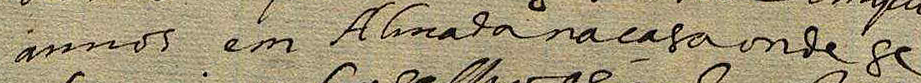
annos em Almada na casa onde se
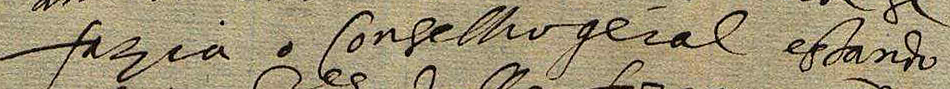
fazia o Conselho geral estando
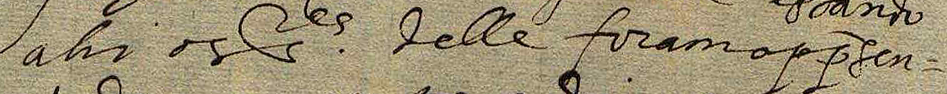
ahi os sres. delle foram app̄sen
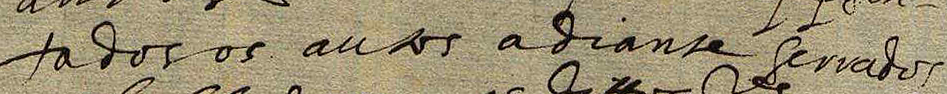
tados os autos adiante serrados
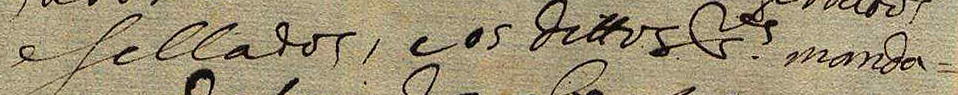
e sellados, e os dittos sres. manda
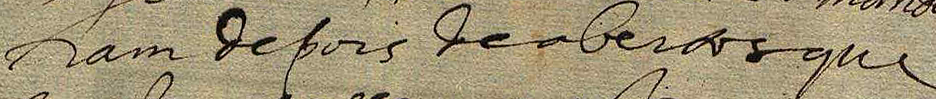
ram depois de abertos que
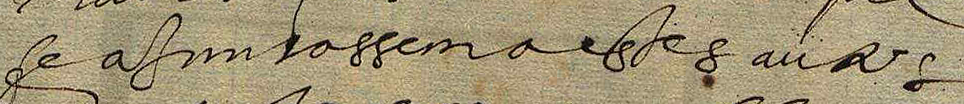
se aJuntassem a estes autos
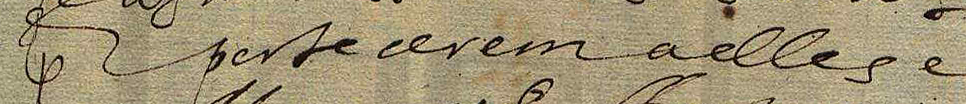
por pertecerem a elles e
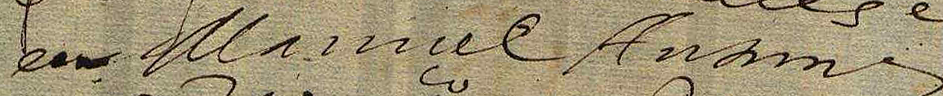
eu Manuel Antunez
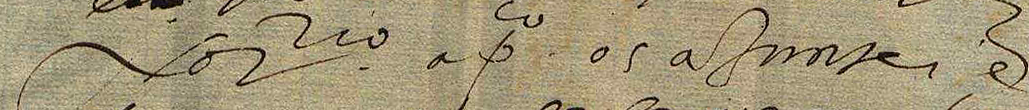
Notrio. apco os aJuntei e
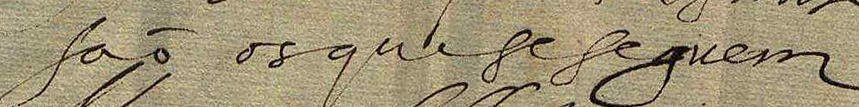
saõ os que se seguem
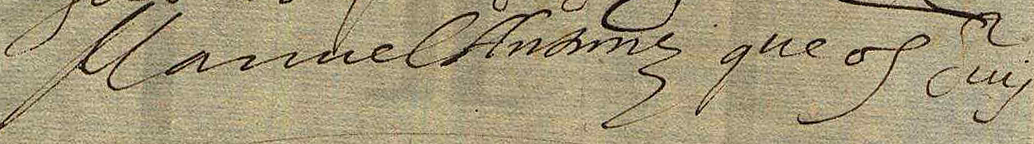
Manuel Antunez que o scruj
